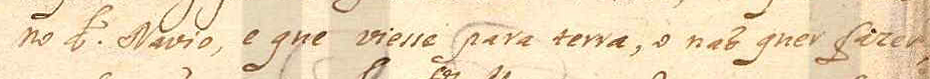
no d̄.o Navio, e que viesse para terra, o naõ quer fazer
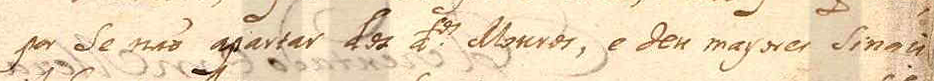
por se naõ apartar dos d̄.os Mouros, e deu mayores sinais
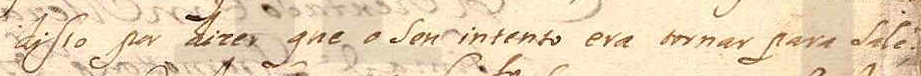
disso por dizer que o seu intento era tornar para Sale;
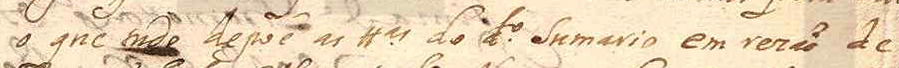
o que inde depoẽ as tt.as do d̄.o Sumario em rezaõ de
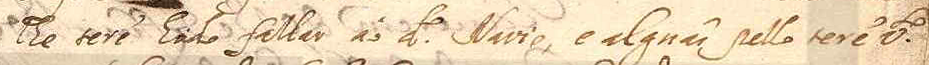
lhe terē hido fallar ao d̄.o Navio, e alguās pello terē v.to
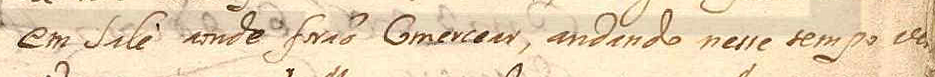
em Salé aonde foraõ Comercear, andando neste tempo ve
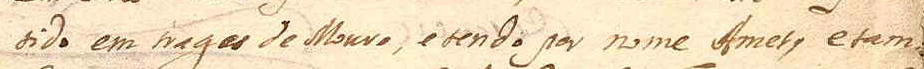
tido em trages de Mouro, e tendo por nome Amet, e tam
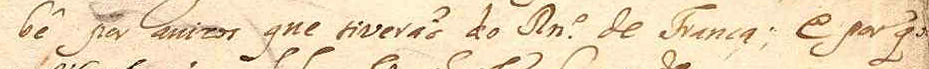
bē por auizos que tiveraõ do Rn.o de França; E porq̄ o
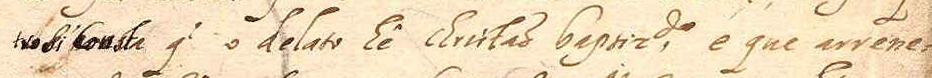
trosi Consta q̄ o delato hé christaõ baptiz,do e que arrene
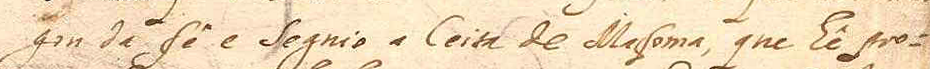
gou da fé e seguio a Ceita de Mafoma, que hé pro
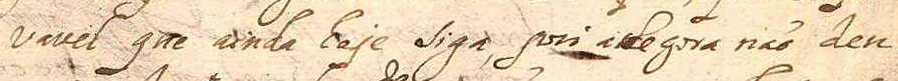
vavel que ainda hoje siga, pois athegora não deu
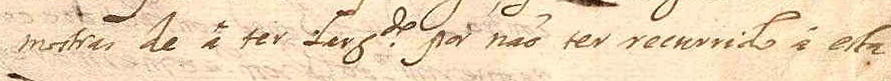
mostras de á ter Larg.do por naõ ter recurrido á esta
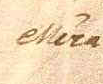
Meza
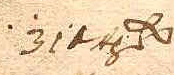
31 d Agto
